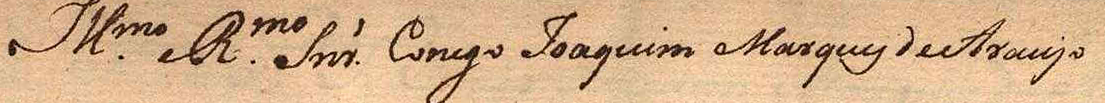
Ill.mo e R.mo Snr̄ Conego Ioaquim Marques de Araujo
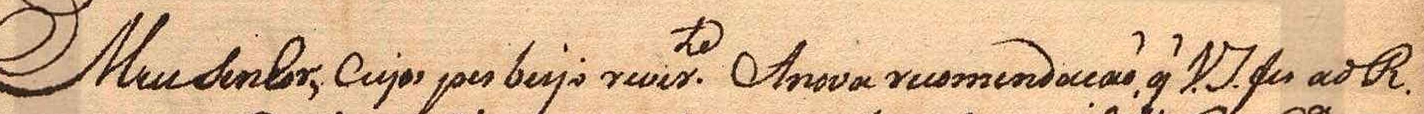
Meu Senhor, Cujos pes beijo rever.te A nova recomendaçaõ, q̄ V.S. fes ao R.
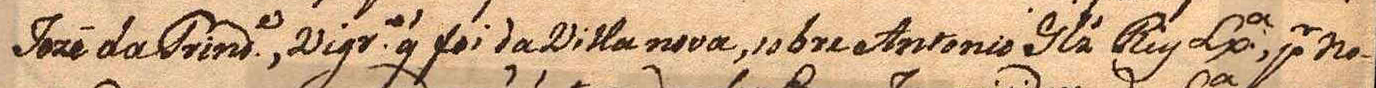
Iozé da Trind.e, Vigr.o q̄ foi da Villa nova, sobre Antonio Glz̄ Reis Lx.a, p.r no
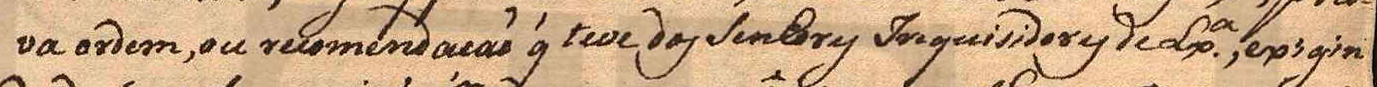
va ordem, ou recomendaçaõ q̄ teve dos Senhores Inquisidores de Lx.a, exigin
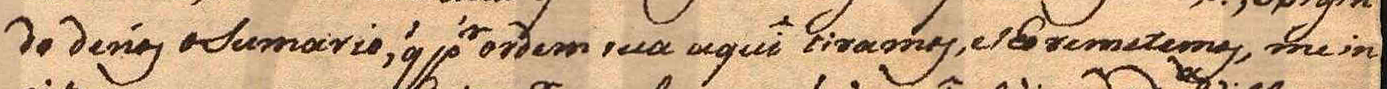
do de nós o Sumario, q̄ p.r ordem sua aqui tiramos, e lho remetemos, me in
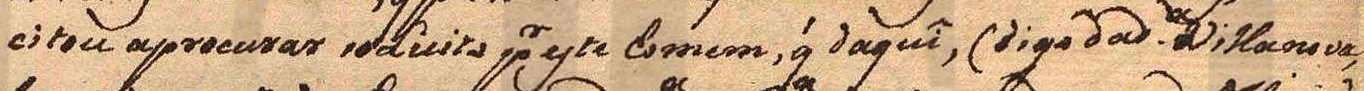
citou a procurar soLicito p.r este homem, q̄ daqui, (digo da d.a Villa nova,
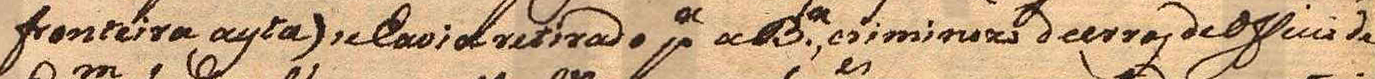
fronteira a esta) se havia retirado p.a a B.a, criminozo de erras de Officio de
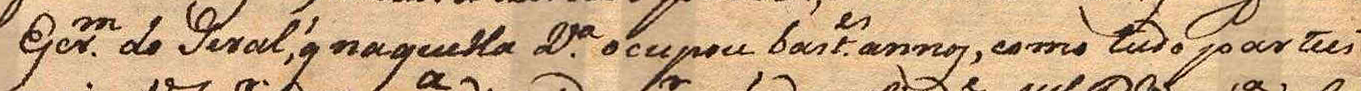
Escr.m do Geral, q̄ naquella V.a ocupou bast.es annos, como tudo parteci
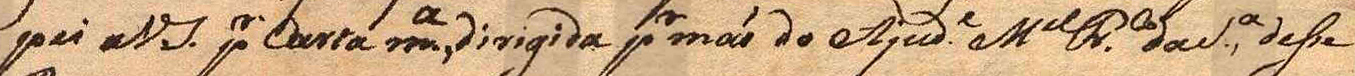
pei a V.S. p.r Carta m.a, dirigida p.r mão do Ajud.e M.el Fr.co da S.a, desse
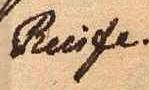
Recife.
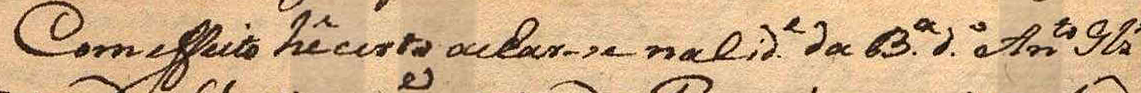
Com effeito he certa achar-se na Cid.e da B.a d.o An.to Glz̄
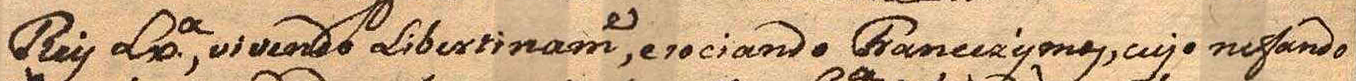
Reis Lx.a, vivendo Libertinam.e, e sociando Francezismos, cujo nefando
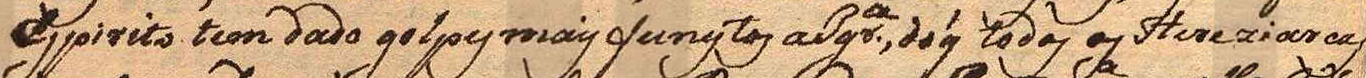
Espirito tem dado golpes mais funestos a Igr.a, do q̄ todas as Hereziarcas
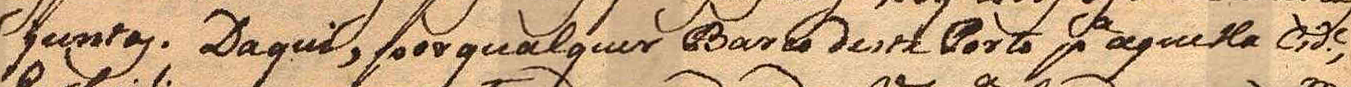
juntas. Daqui, por qualquer Barco deste Porto p.a aquella Cid.e,
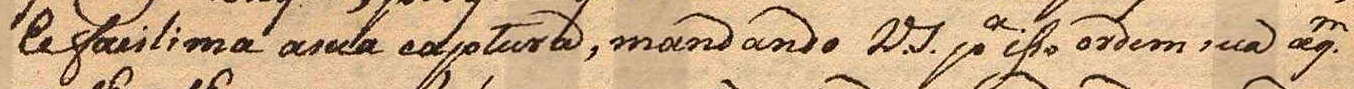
he facilima a sua captura, mandando V.S. p.a isso ordem sua a q.m
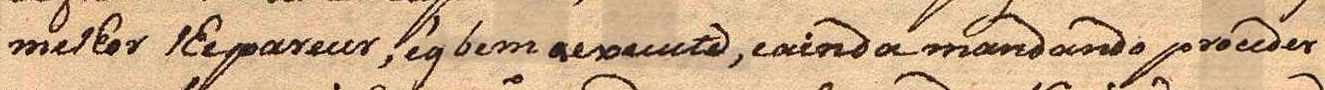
melhor lhe parecer, e q̄ bem a execute, e ainda mandando proceder
